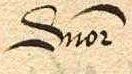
Snōr
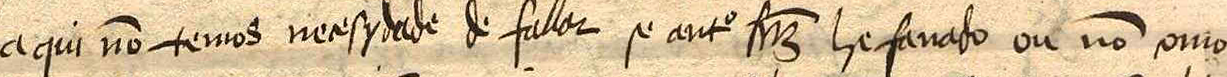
aqui nō temos necesydade de fallar se anto fr̄rz he fanado ou nō como
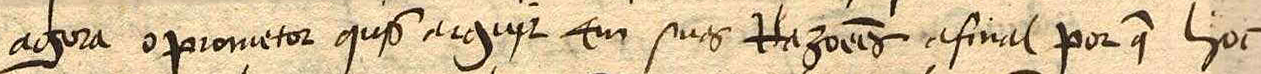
agora o prometor qujs argujr Em suas Razoẽes a final porq̄ hoc
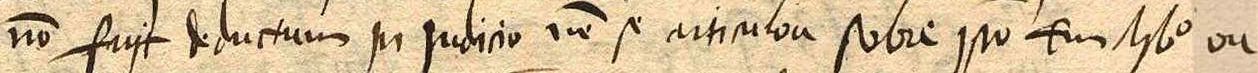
nō fujt deductum jn Judicio nē se articulou sobre jsso Em ljbo ou
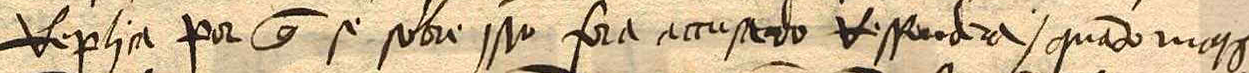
Repljca porq̄ se sobre jsso fora accusado Respondera / quāto majs
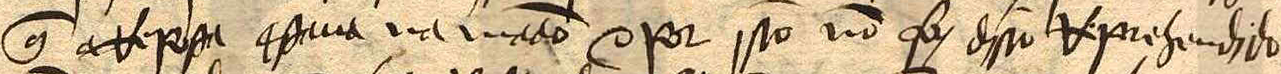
q̄ a Reposta Estaua na mãao e por jsso nō foj djsso Reprehendjdo
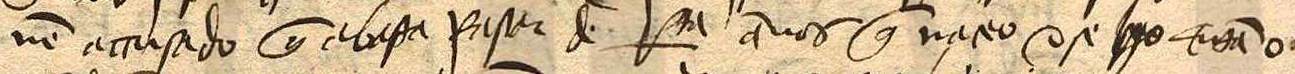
nē accusado q̄ abasta pasar de Rta ānos q̄ naçeo e se logo Entā o
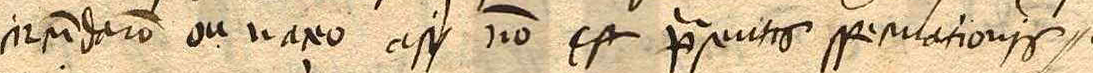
circūdarō ou naçeo asy nō Est p̄sentes speculationjs //
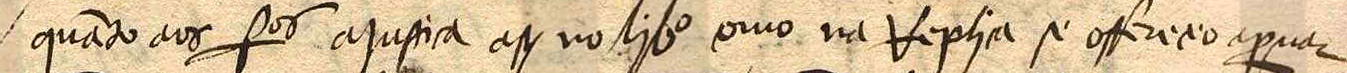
quāto aos fos a Justiça asy no ljbo como na Repljca se offereceo a ꝓuar
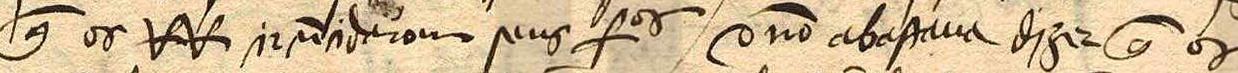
q̄ os RR circūcidarom seus fos / e nō abastaua djzer q̄ os
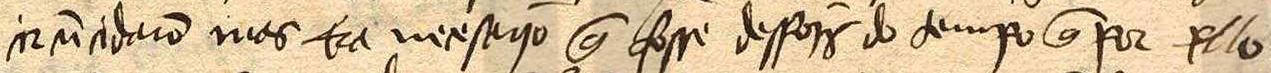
circūcidarō mas Era necesarjo q̄ fosse despojs do tempo q̄ por Ello
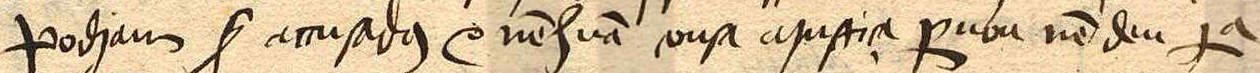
podjam ꞩ accusadꝯ e nēnhuā cousa a Justiça ꝓuou nē deu ta
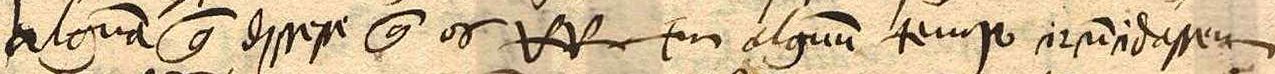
algūa q̄ djssesse q̄ os RR Em algūu tempo circūcidassem
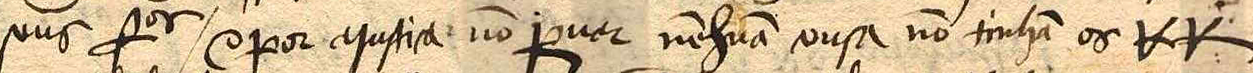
seus fos / e por a Justiça nō ꝓuar nēhuā cousa nō tinhā os RR
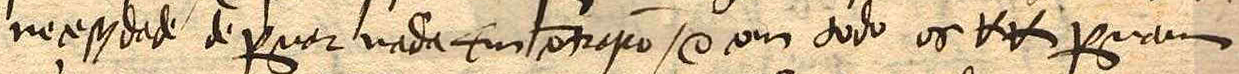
neçesydade de ꝓuar nada Em c̄otrajro / e comtodo os RR ꝓuam
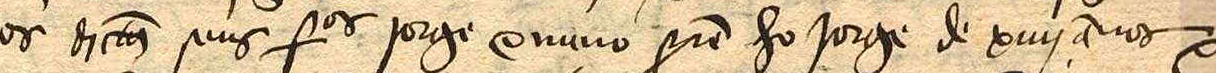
os djc̄tꝯ seus fos Jorge e nuno ꞩrē ho Jorge de xiiij ānos e
